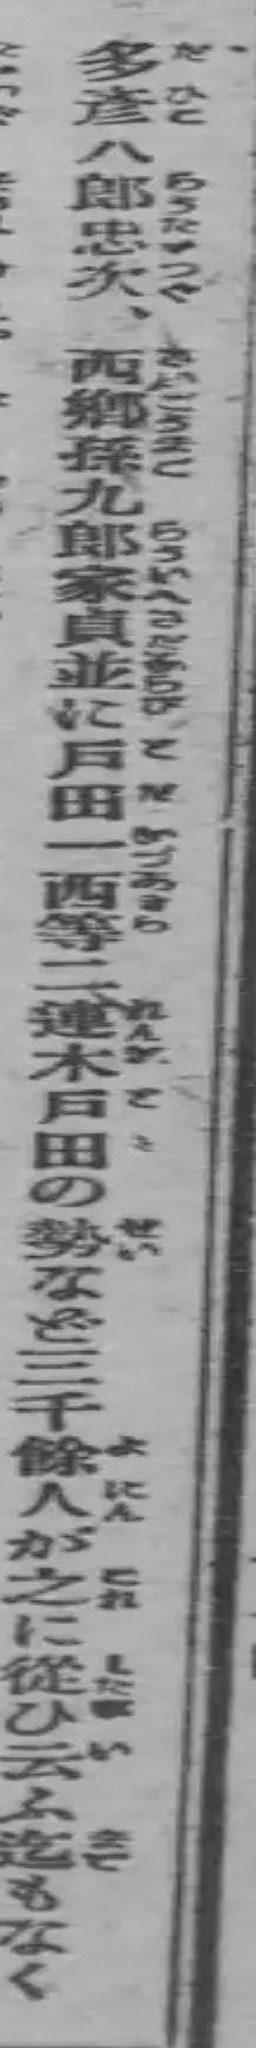多彦八郎忠次、西郷孫九郎家貞並に戸田一西等二連木戸田の勢など三千余人が之に従ひ云ふ迄もなく
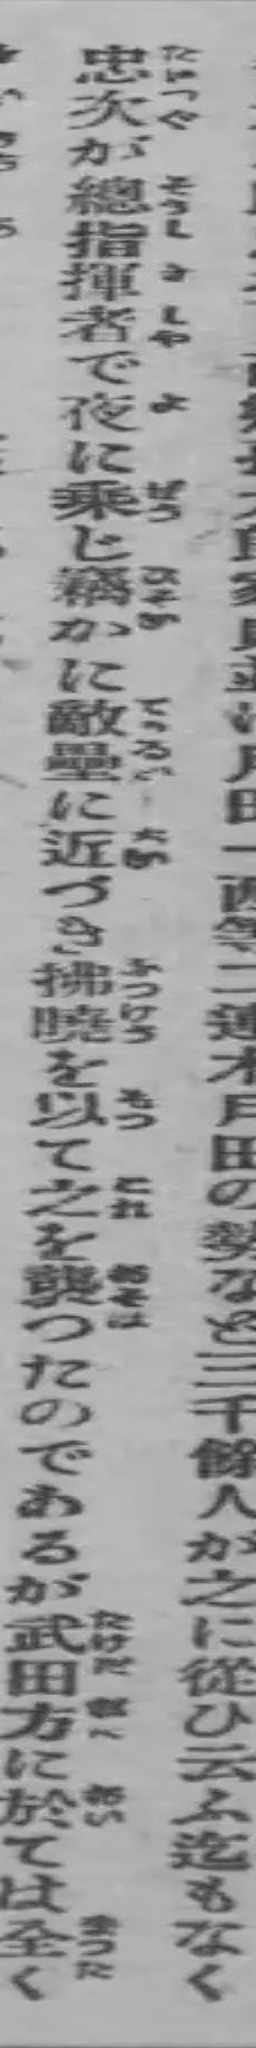忠次が総指揮者で夜に乗じ竊かに敵塁に近づき払暁を以て之を襲つたのであるが武田方に於ては全く
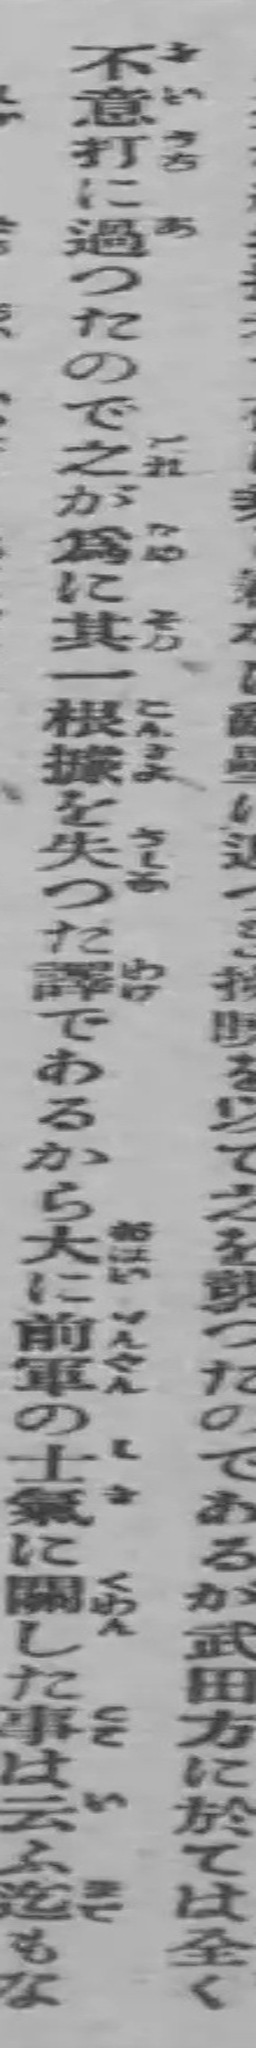不意打に過つたので之が為に其一根拠を失つた訳であるから大に前軍の士気に関した事は云ふ迄もな
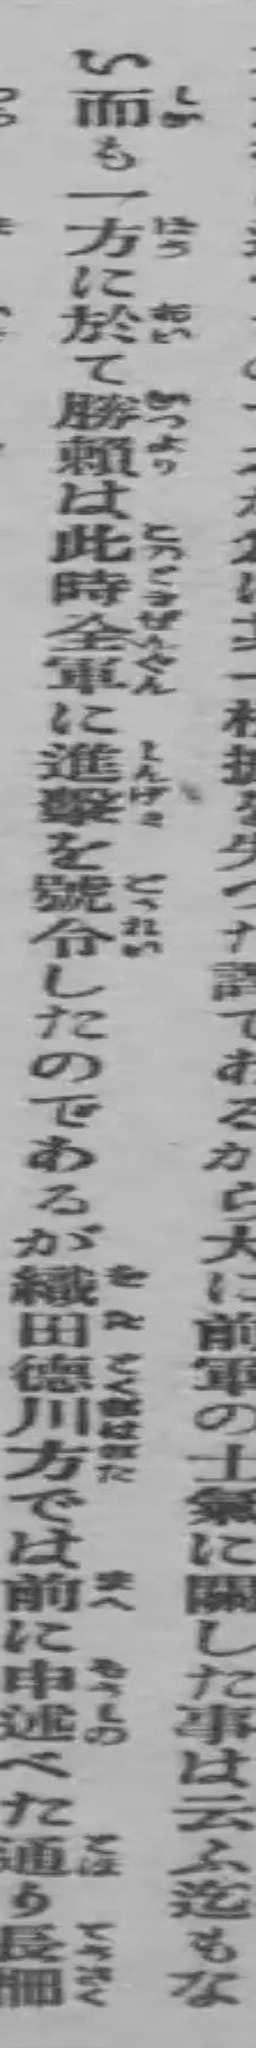い而も一方に於て勝頼は此時全軍に進撃を号令したのであるが織田徳川方では前に申述べた通り長柵
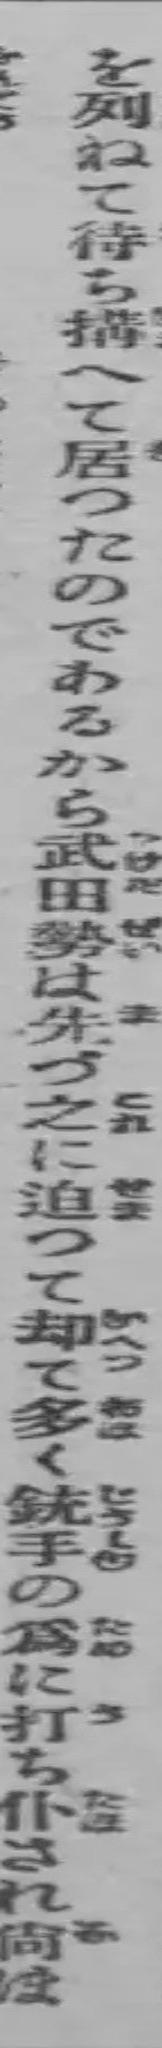を列ねて待ち搆へて居つたのであるから武田勢は先づ之に迫つて却て多く銃手の為に打ち仆され尚ほ
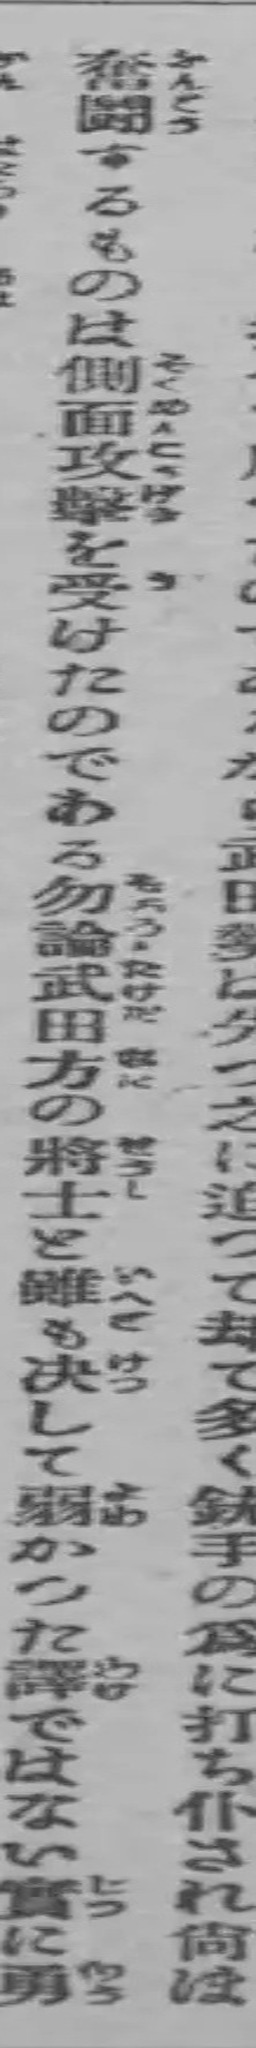奮闘するものは側面攻撃を受けたのである勿論武田方の将士と雖も決して弱かつた訳ではない実に勇
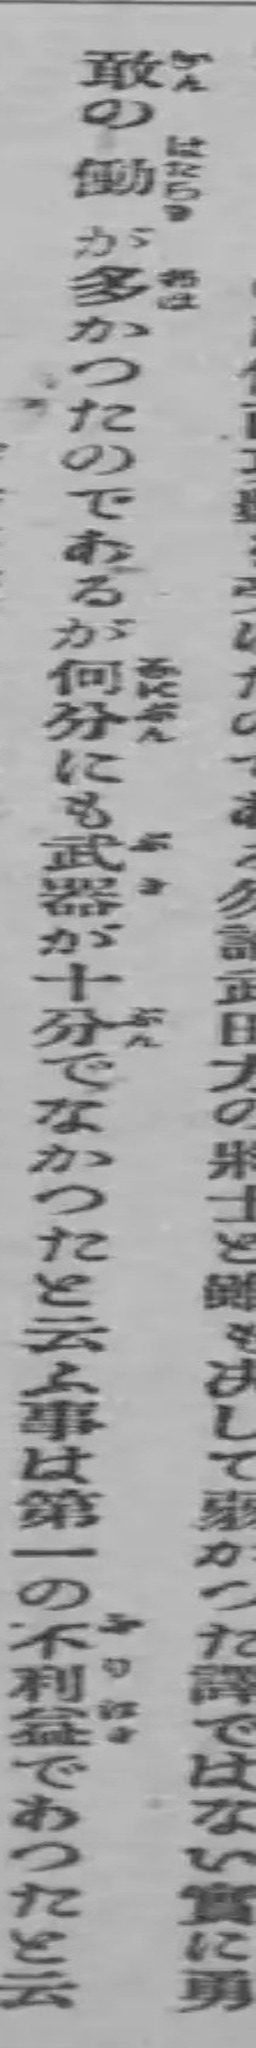敢の働が多かつたのであるが何分にも武器が十分でなかつたと云ふ事は第一の不利益であつたと云
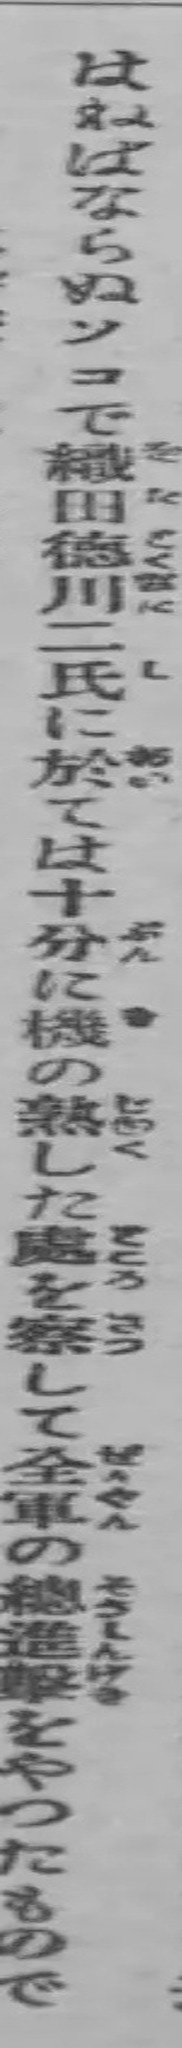はねばならぬソコで織田徳川氏二氏に於ては十分に機の熟した処を察して全軍の総進撃をやつたもので
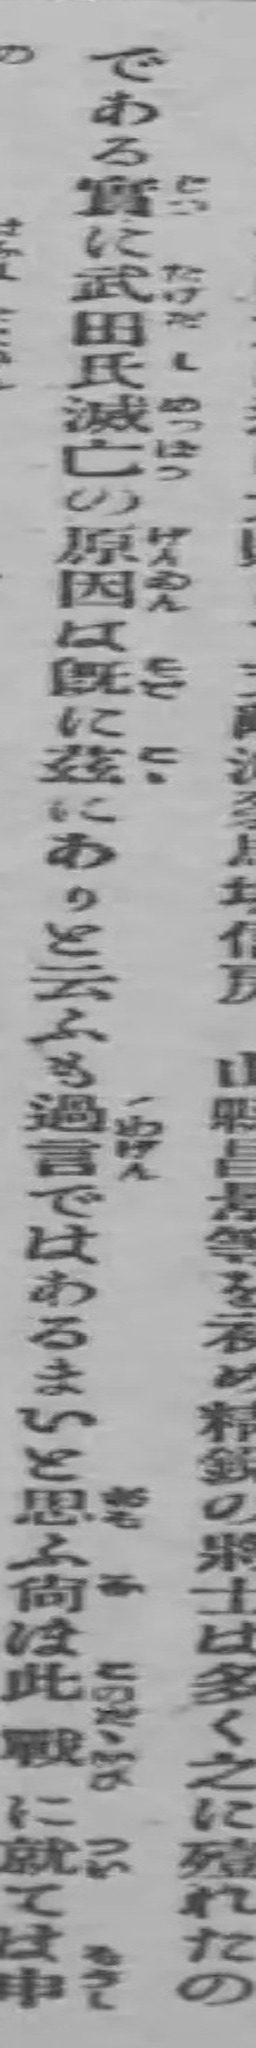である実に武田氏滅亡の原因は既に茲にありと云ふも過言ではあるまいと思ふ尚ほ此戦に就ては申
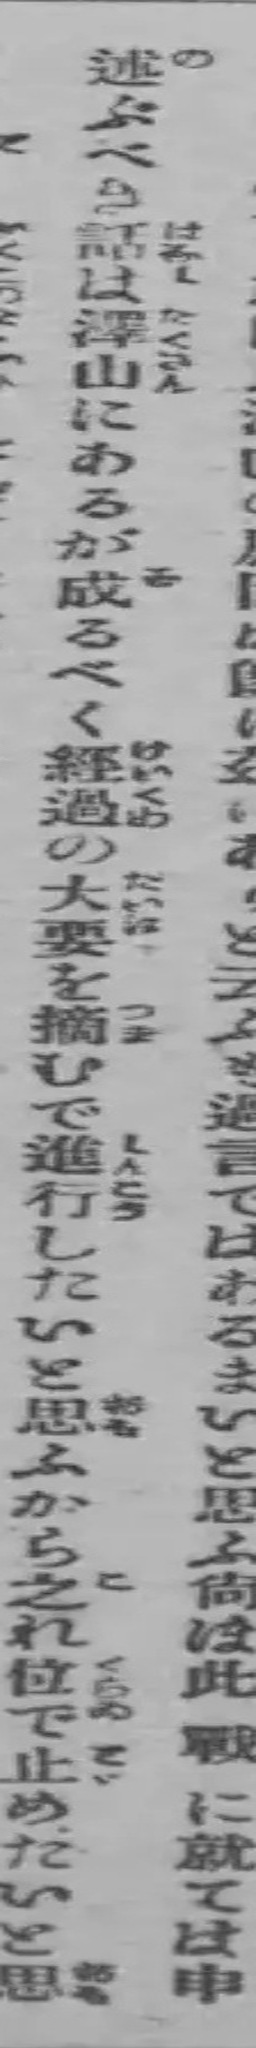述ぶべき話は沢山にあるが成るべく経過の大要を摘むで進行したいと思ふから之れ位で止めたいと思
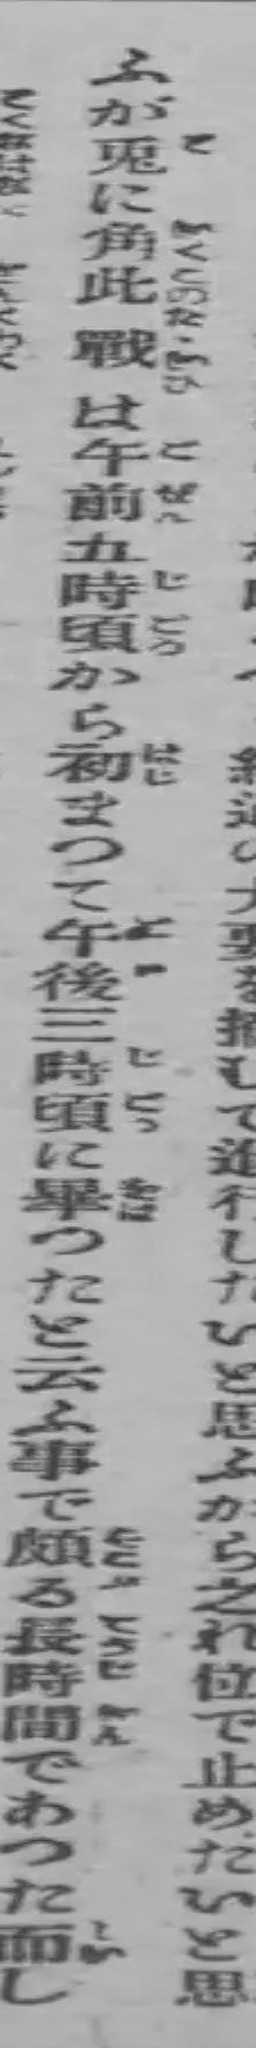ふが兎に角此戦は午前五時頃から初まつて午後三時頃に畢つたと云ふ事で頗る長時間であつた而し
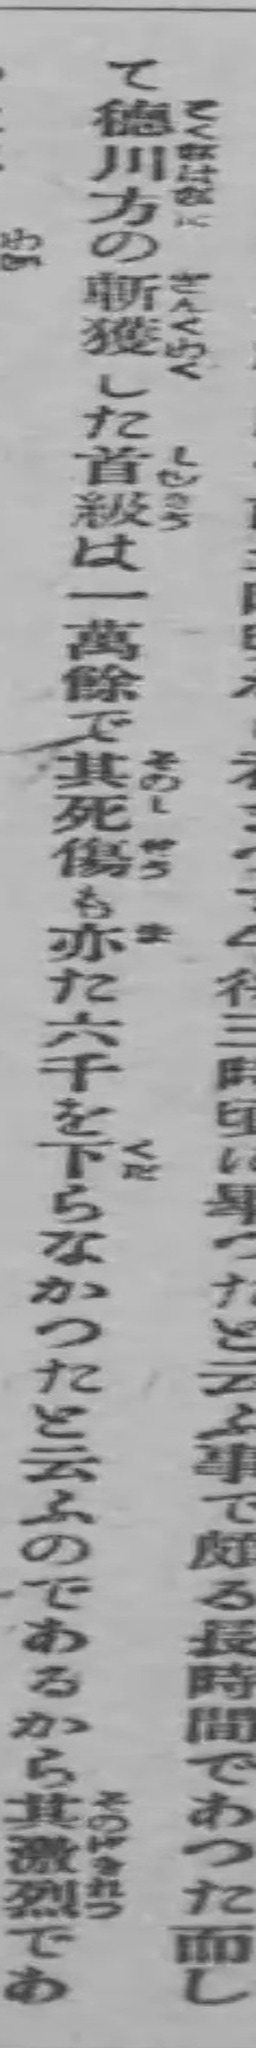て徳川方の斬獲した首級は一万余で其死傷も亦た六千を下らなかつたと云ふのであるから其激烈であ
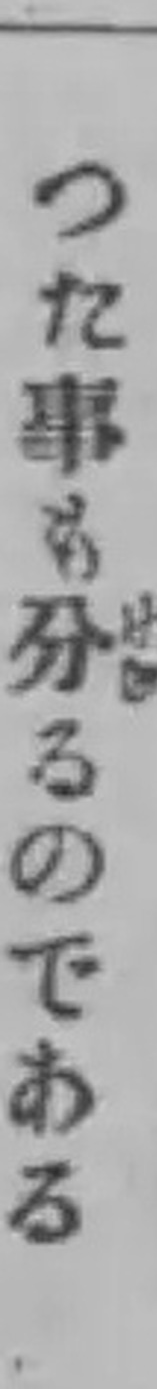つた事も分るのである
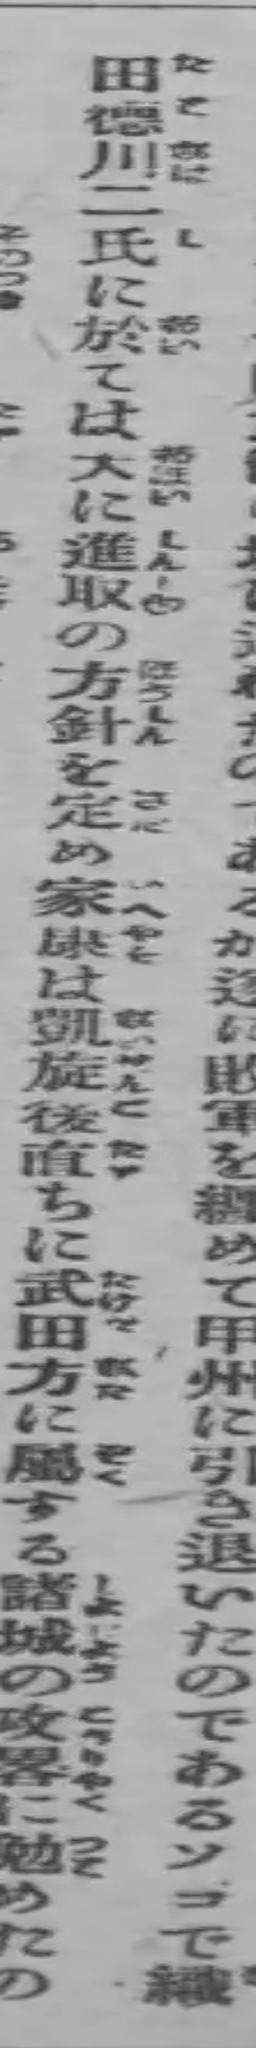田徳川二氏に於ては大に進取の方針を定め家康は凱旋後直ちに武田方に属する諸城の攻略に勉めたの
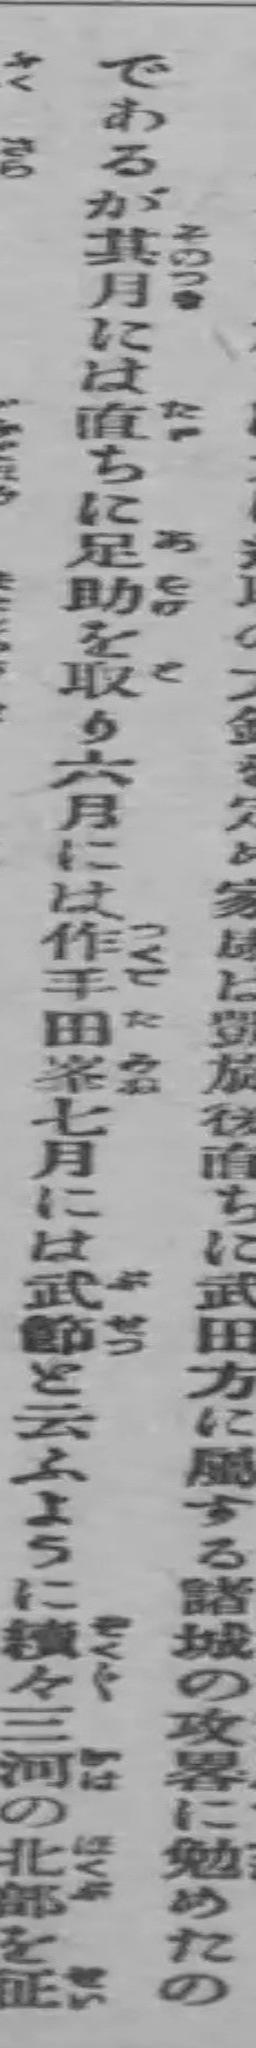であるが其月には直ちに足助を取り六月には作手田峯七月には武節と云ふように続々三河の北部を征
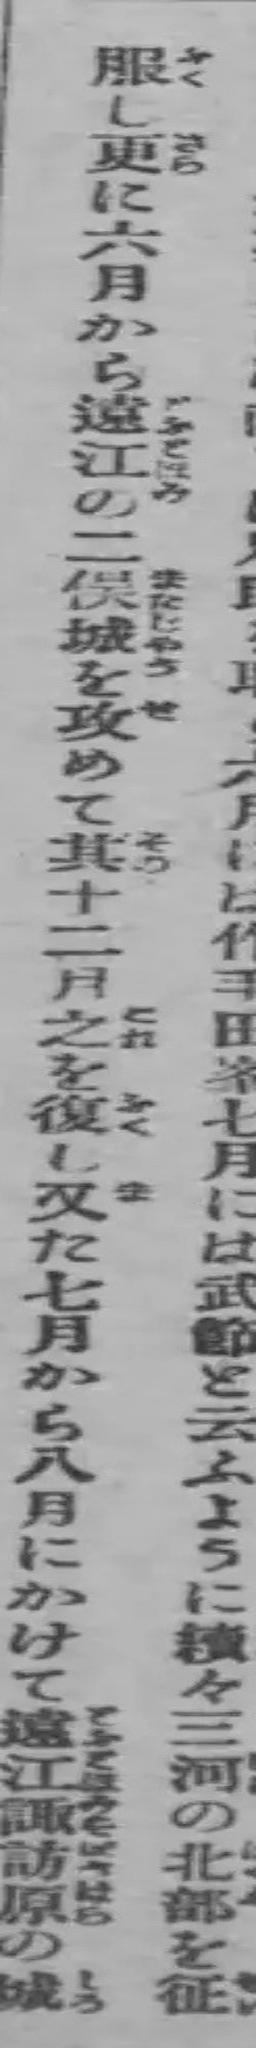服し更に六月から遠江の二俣城を攻めて其十二月之を復し又た七月から八月にかけて遠江諏訪原の城
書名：豊橋市史談
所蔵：国立国会図書館 National Diet Library, JAPAN
